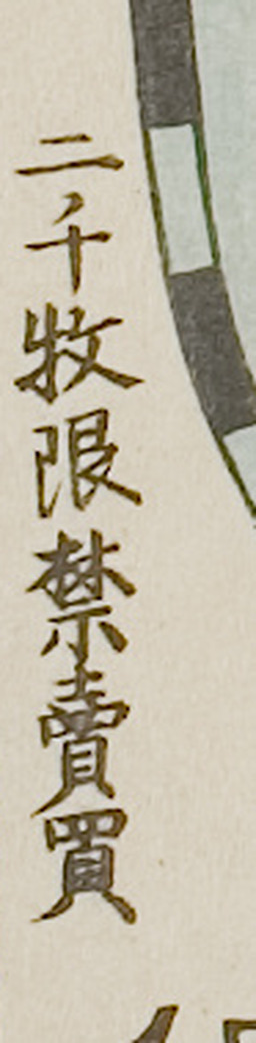二千枚限禁賣買
